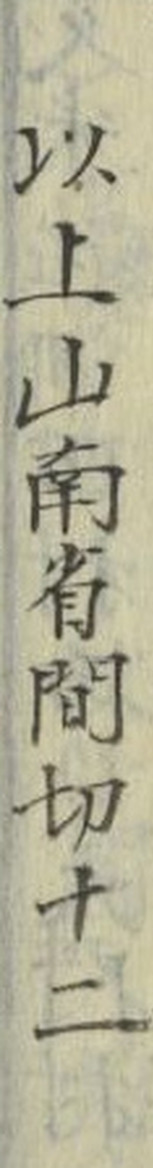以上山南省間切十二
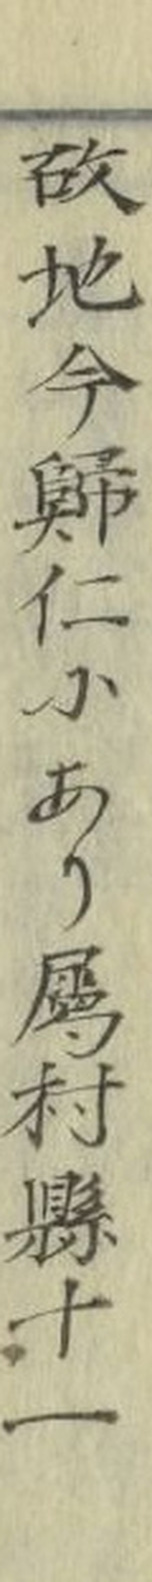故地今帰仁にあり属村県十一
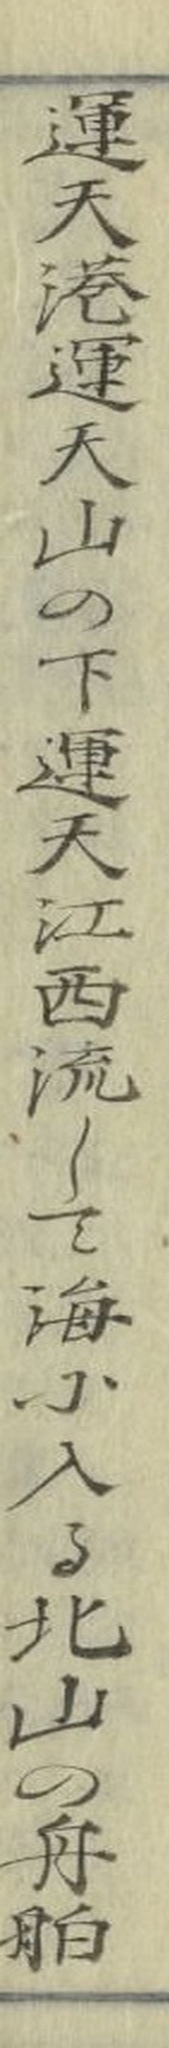運天港運天山の下運天江西流して海に入る北山の舟舶
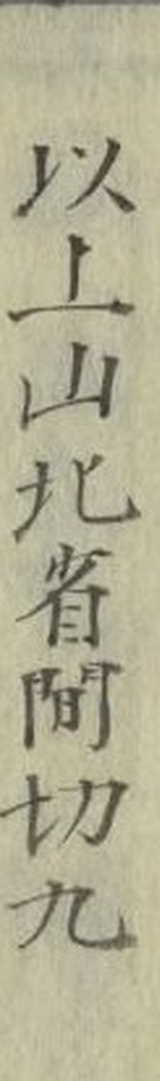以上山北省間切九
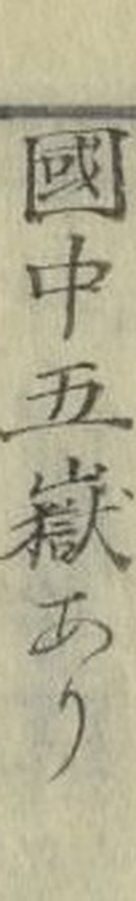国中五嶽あり

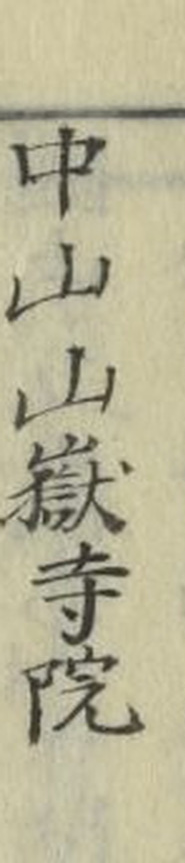中山山嶽寺院
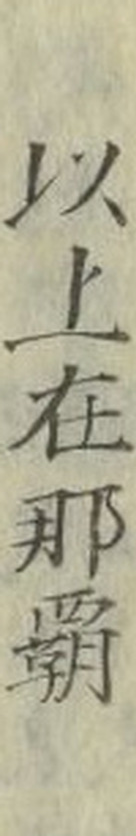以上在那覇
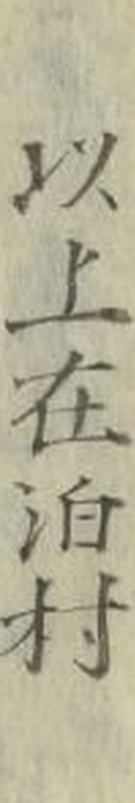以上在泊村

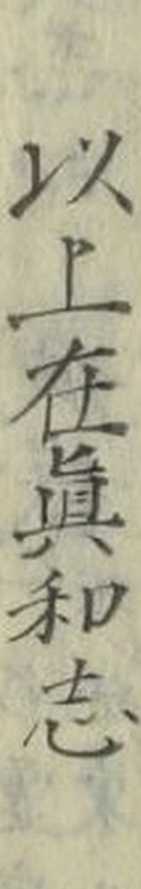以上在眞和志
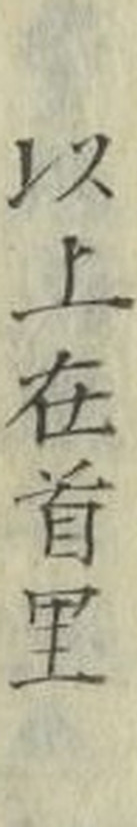以上在首里
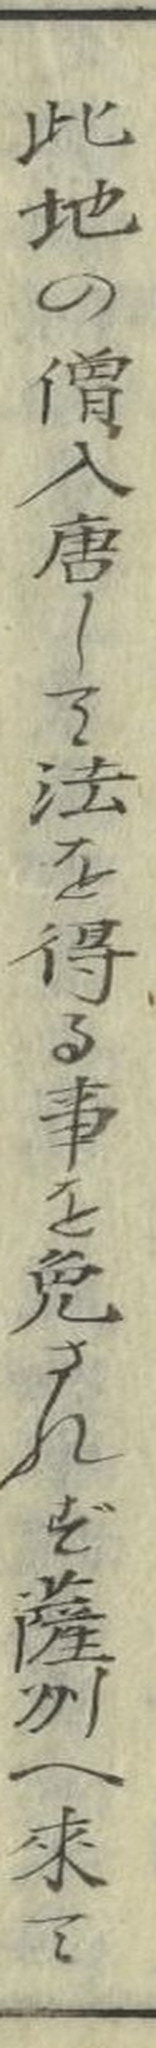此地の僧入唐して法を得る事を免されず薩州へ来て
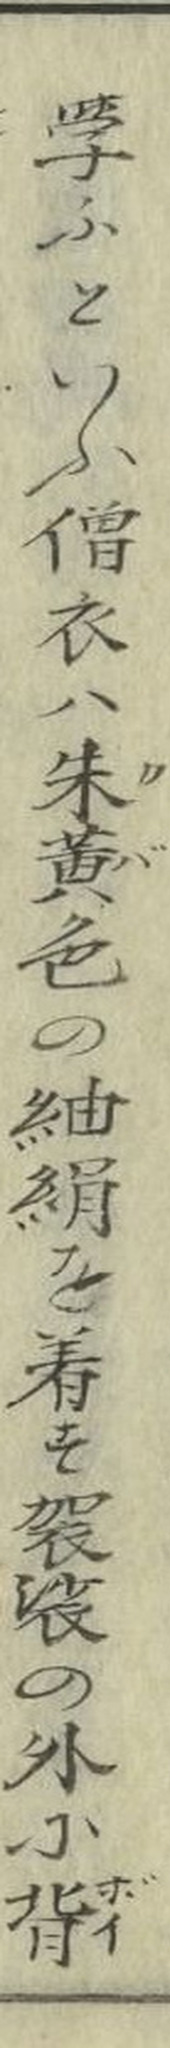学ふといふ僧衣は朱黄色の紬絹を着す袈裟の外に背
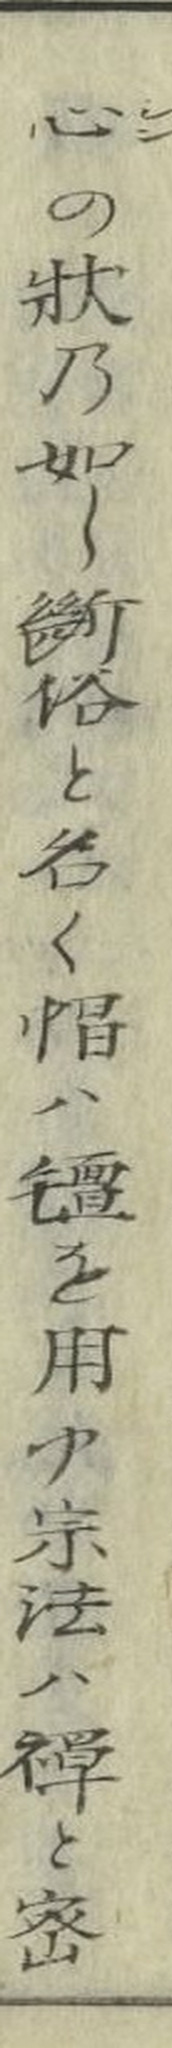心の状の如し断俗と名く帽は氈を用ゆ宗法は禅と密
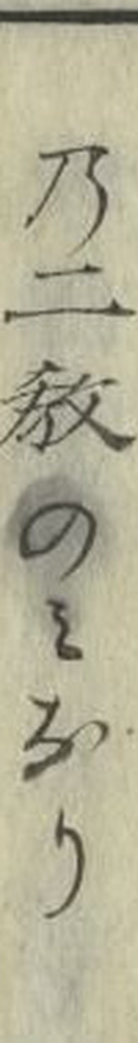の二教のみなり

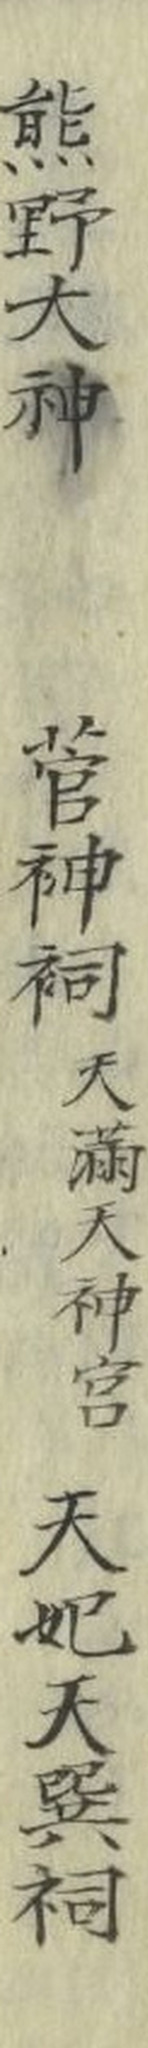熊野大神菅神祠天満天神宮天妃天巽祠
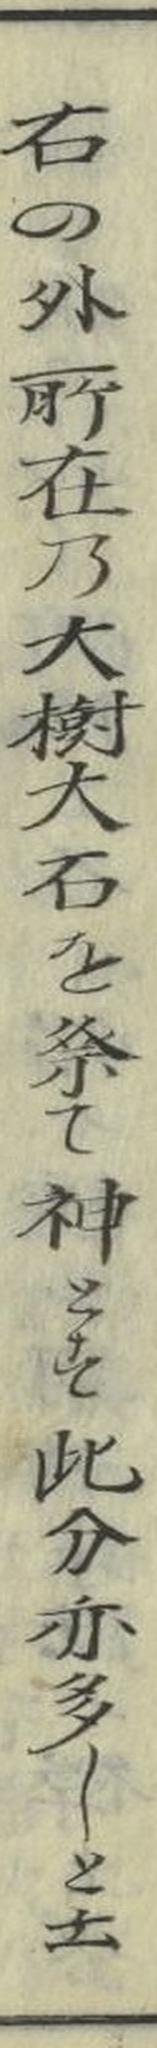右の外所在の大樹大石を祭て神とす此分亦多しと云
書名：琉球沿革志 上
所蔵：University of the Ryukyus Library
